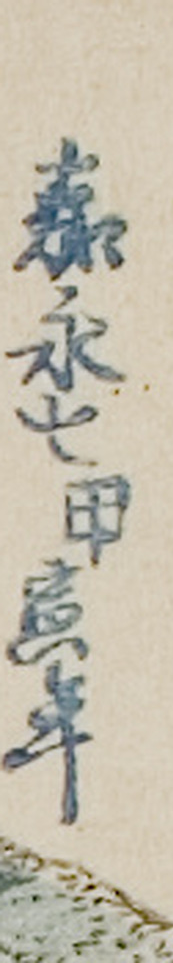嘉永七甲寅年
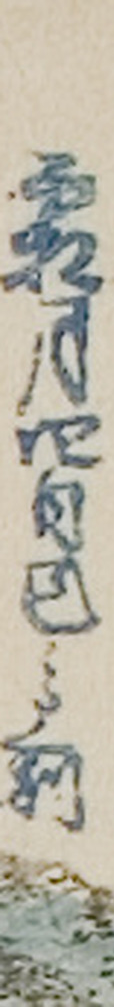霜月四日巳之上刻
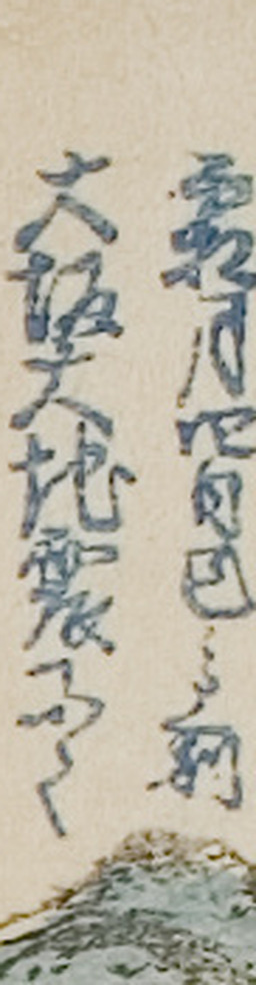大坂大地震有之
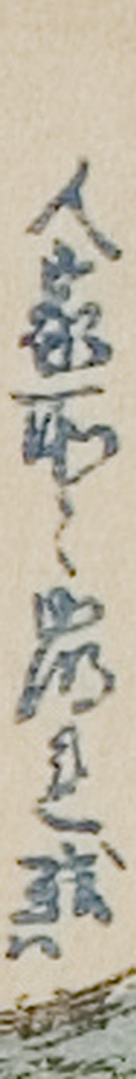人家所々崩れ残ハ
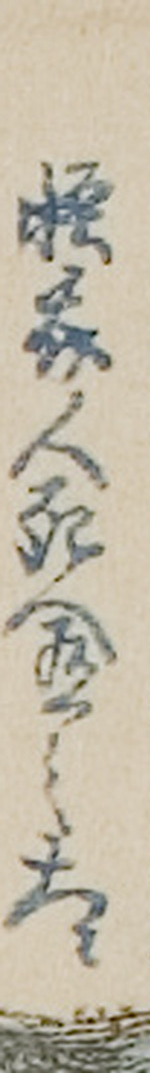怪我人死人有之大二
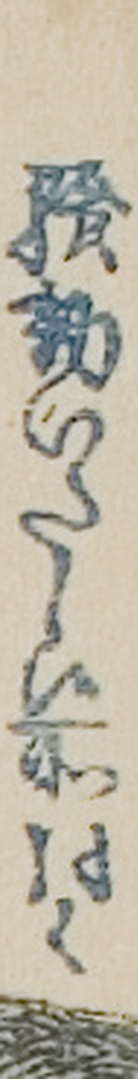騒動いたし候所よく
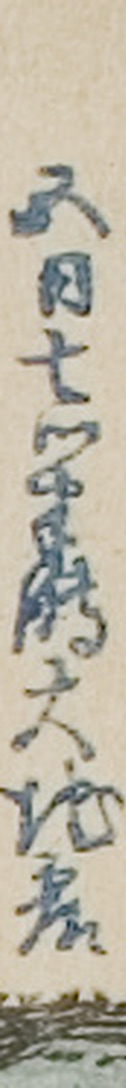五日七ツ半時大地震
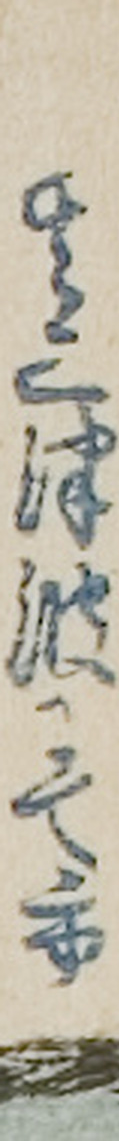其上津波にて市
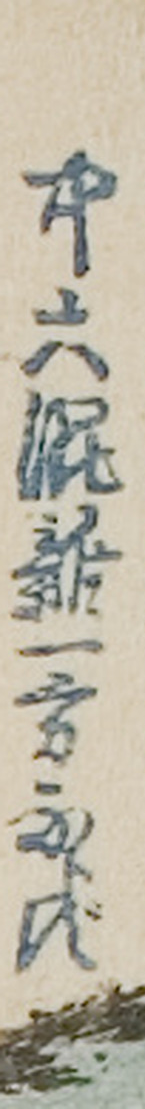中大混雑一方ならず
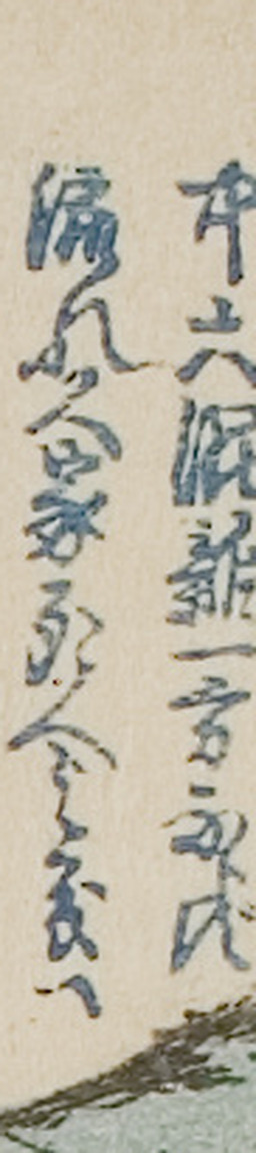流れ人家死人之義は
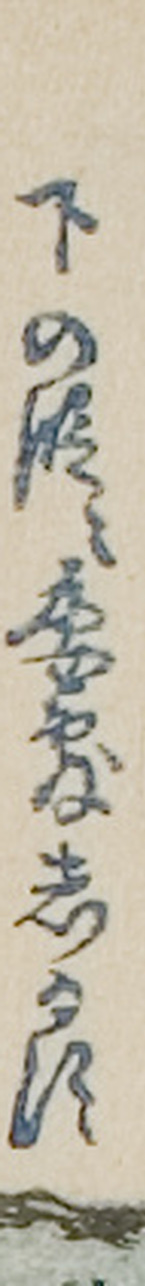下の段二委敷しるす
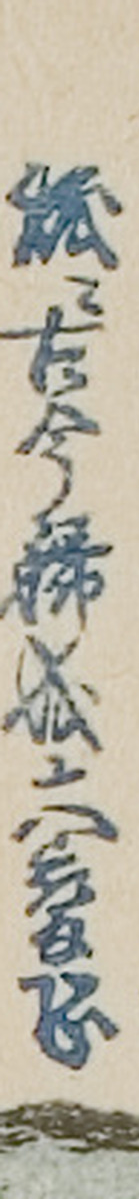誠二古今稀成大変成
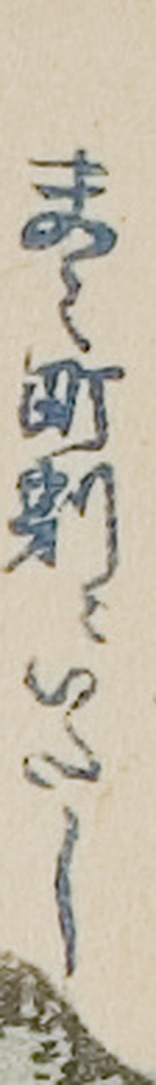夫々町別二いたし
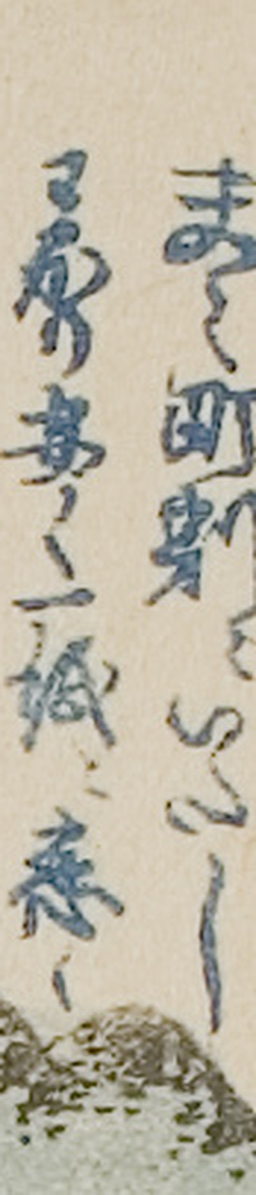わかり安く一紙に表し
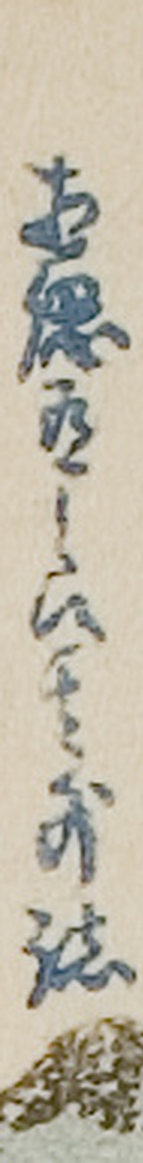相認有之候其外諸
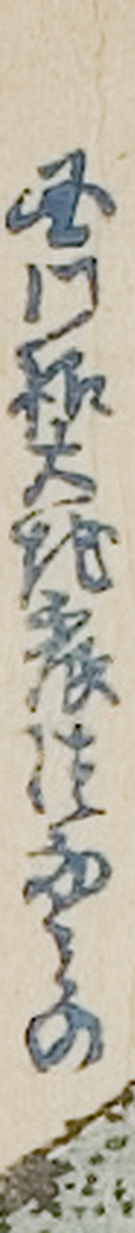国同様大地震つなミの
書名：諸国大阪大地震大津波細見一覧
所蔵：東京大学総合図書館 General Library in the University of Tokyo, JAPAN
